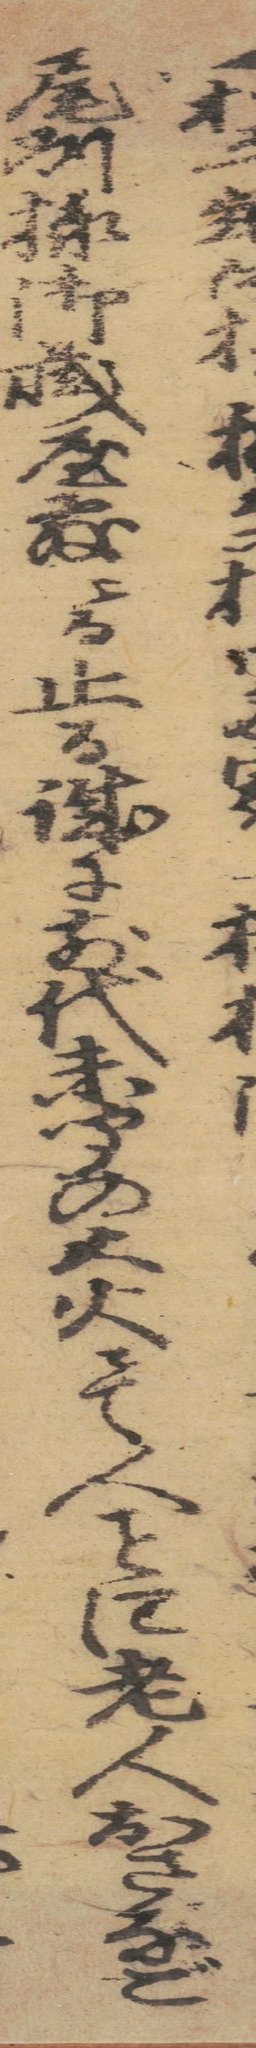尾州様御蔵屋敷にて止る誠に前代未聞の大火にて人ことに老人おさなご
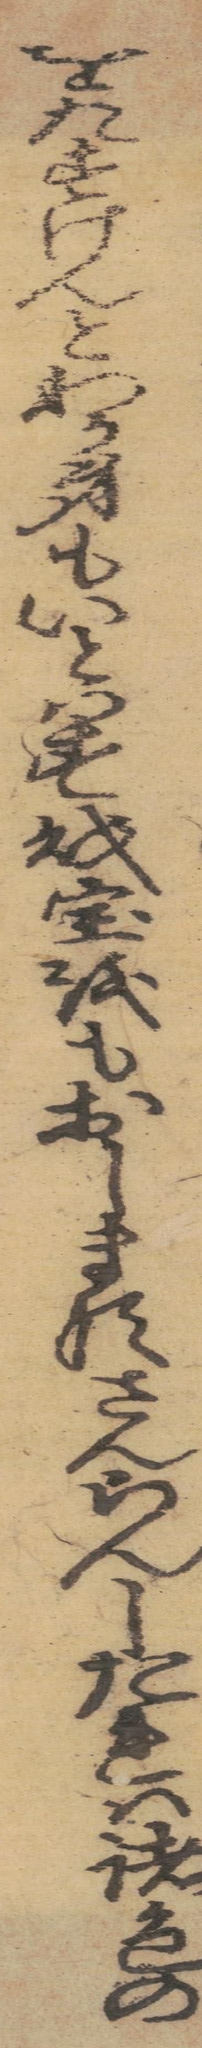をたすけんとわか身もいとはす財宝をもおしますさんらんしたれは諸色の
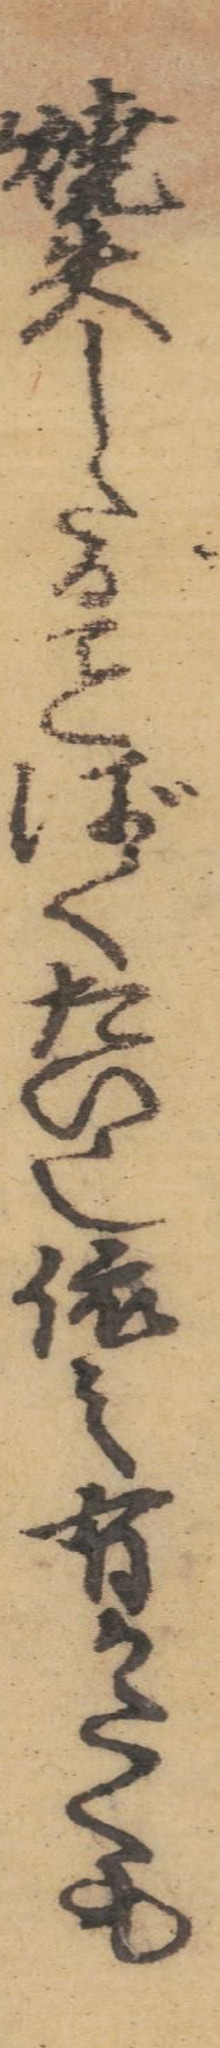焼失したることばくたい也依之有かたくも
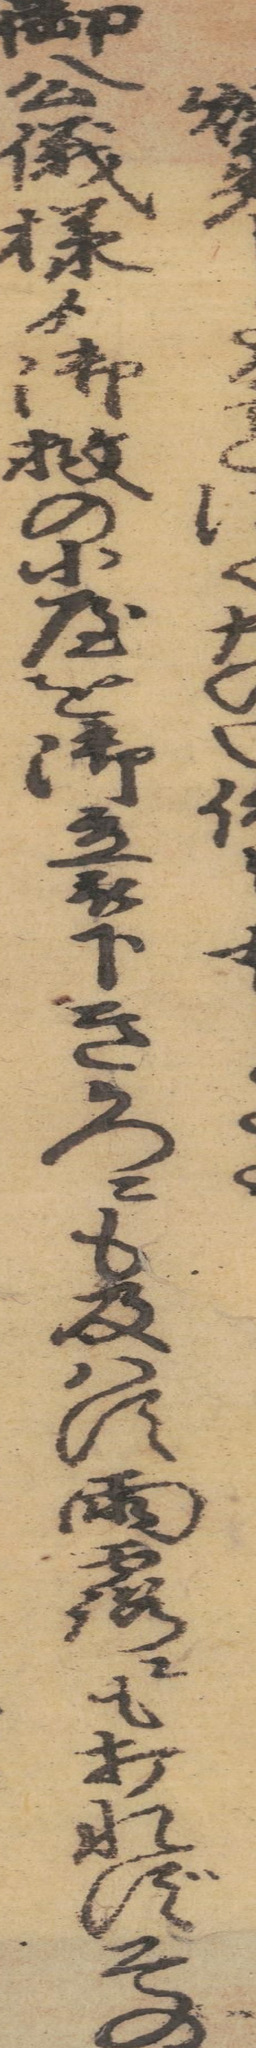御公儀様ゟ御救の小屋を御立被下きかつにも及はす雨露にも打れずその
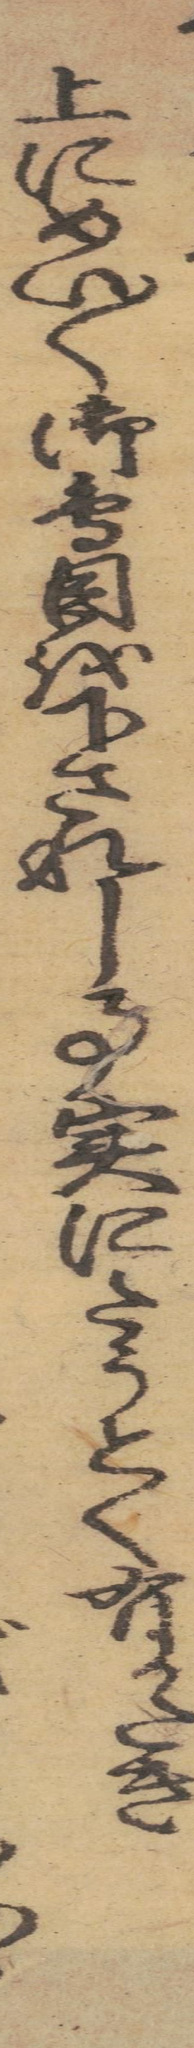上にめい〳〵御鳥目を下されし事実にたうとく有かたき
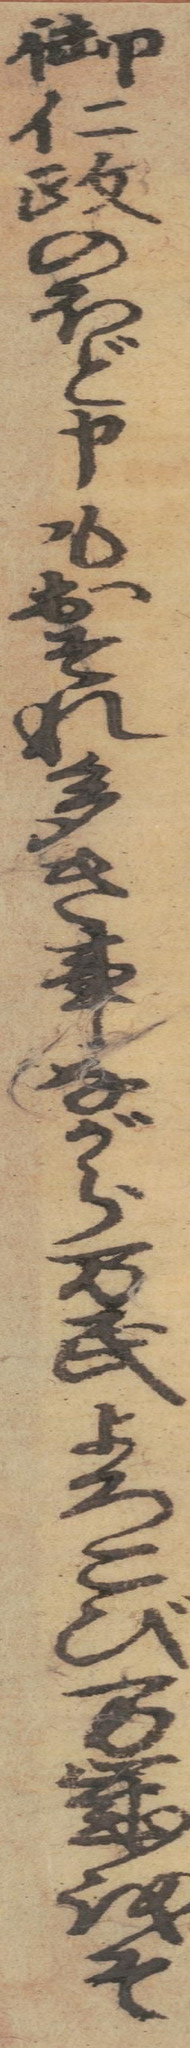御仁政のほど申もおそれ多き事ながら万民よろこび万歳をそ
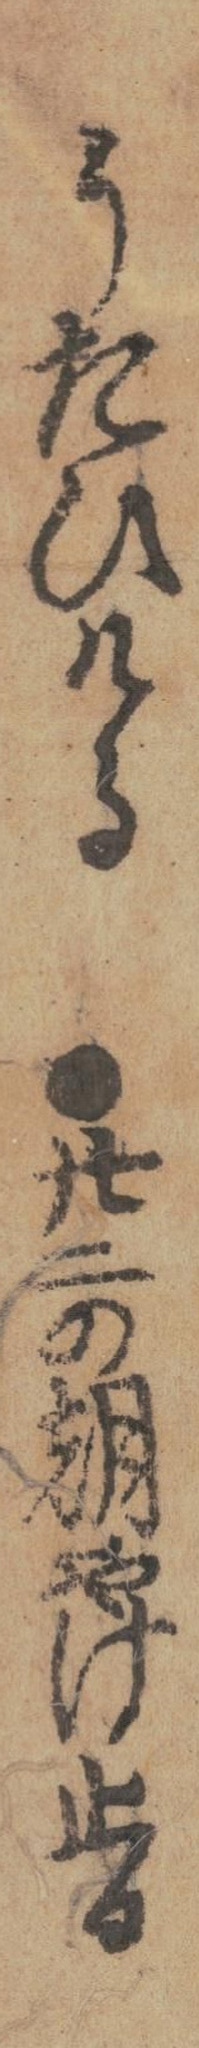うたひかる●廿二の朝やけ止る
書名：方角場所附
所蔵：東京大学地震研究所図書室 Earthquake Research Institute Library, The University of Tokyo, JAPAN
